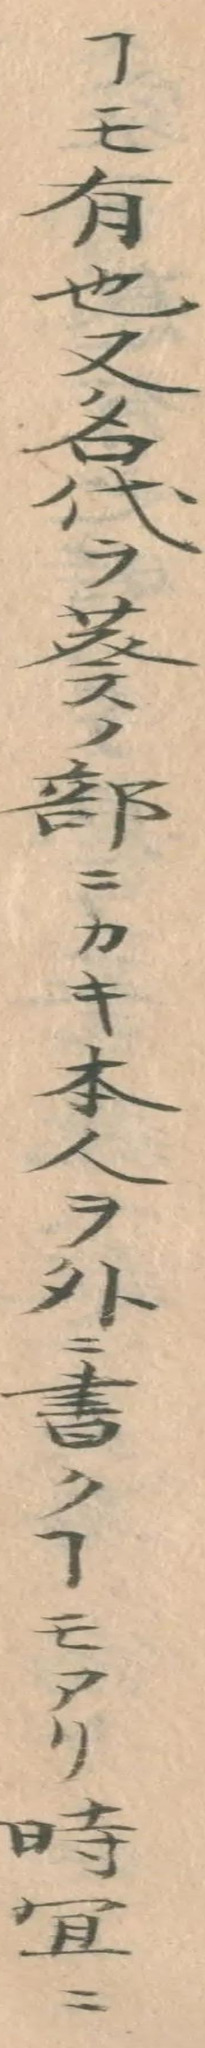ヿモ有也又名代ヲ葵ノ部ニカキ本人ヲ外ニ書クヿモアリ時宜ニ
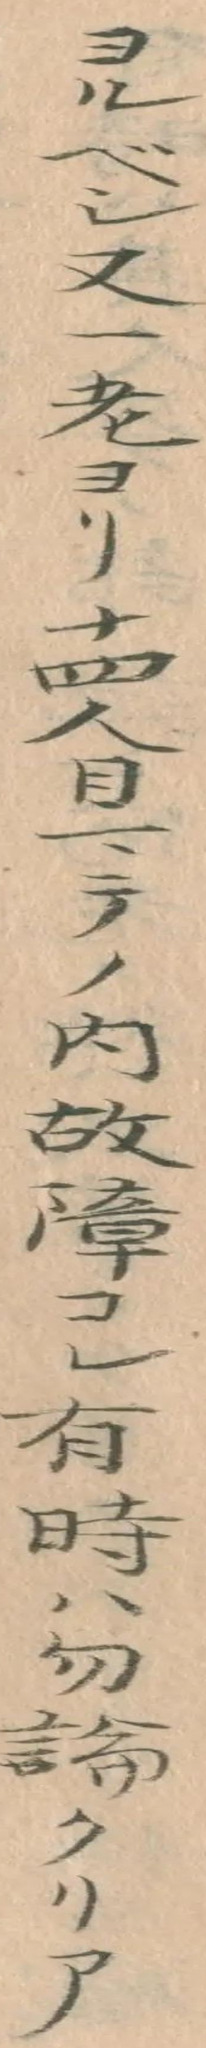ヨルベシ又一老ヨリ十四人目マテノ内故障コレ有時ハ勿論クリア
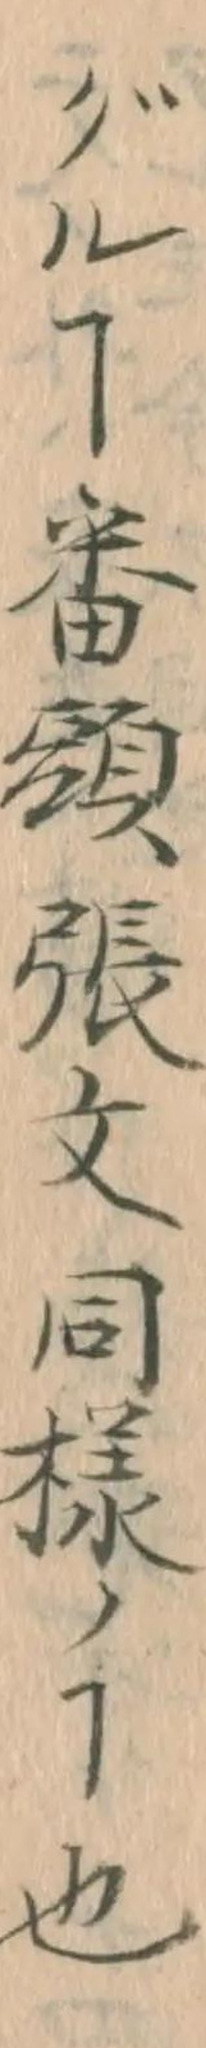グルヿ番頭張文同様ノヿ也
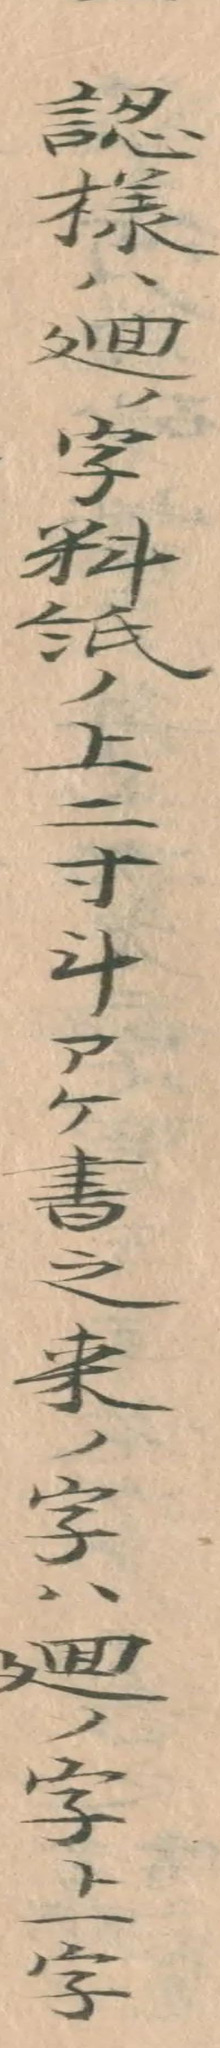一認様ハ廻ノ字料紙ノ上二寸斗アケ書之来ノ字ハ廻ノ字ト一字
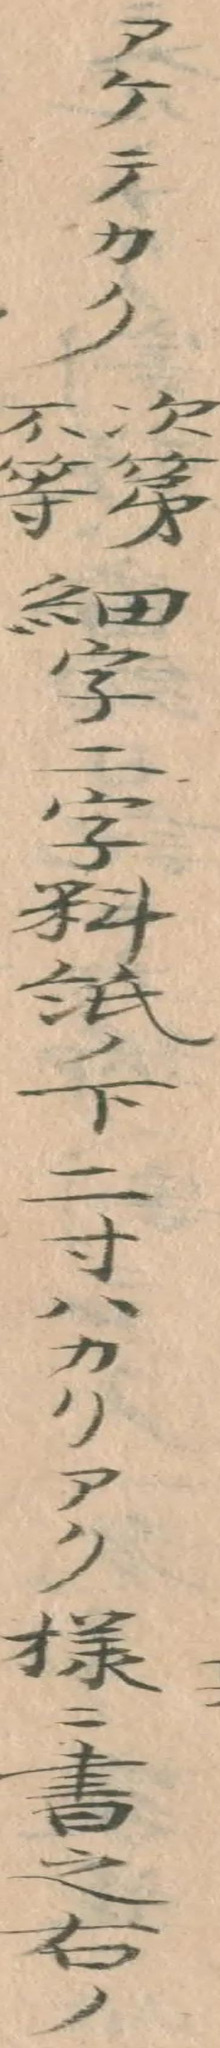アケテカク次第不等細字二字料紙ノ下二寸ハカリアク様ニ書之右ノ
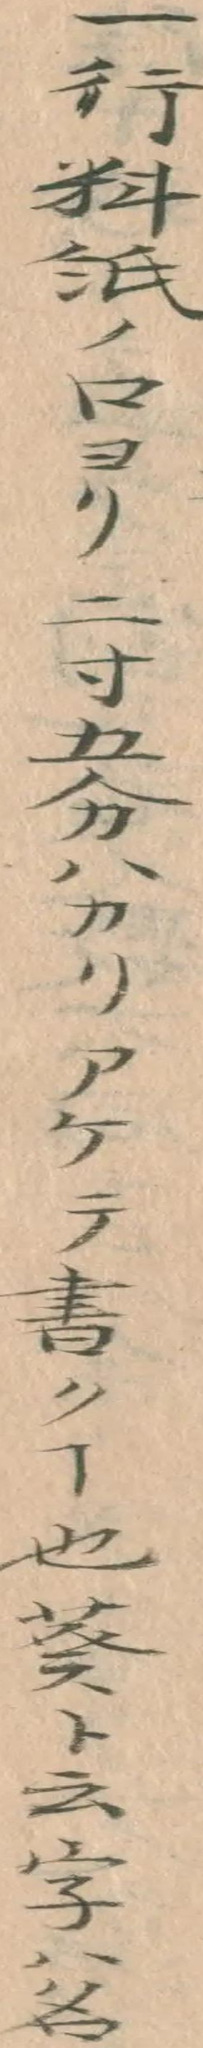一行料紙ノ口ヨリ二寸五分ハカリアケテ書クヿ也葵ト云字ハ名
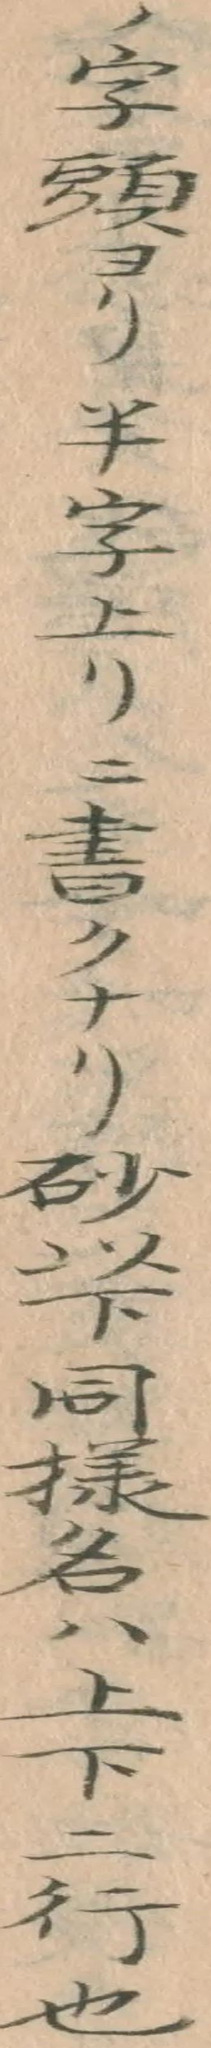ノ字頭ヨリ半字上リニ書クナリ砂以下同様名ハ上下ニ行也
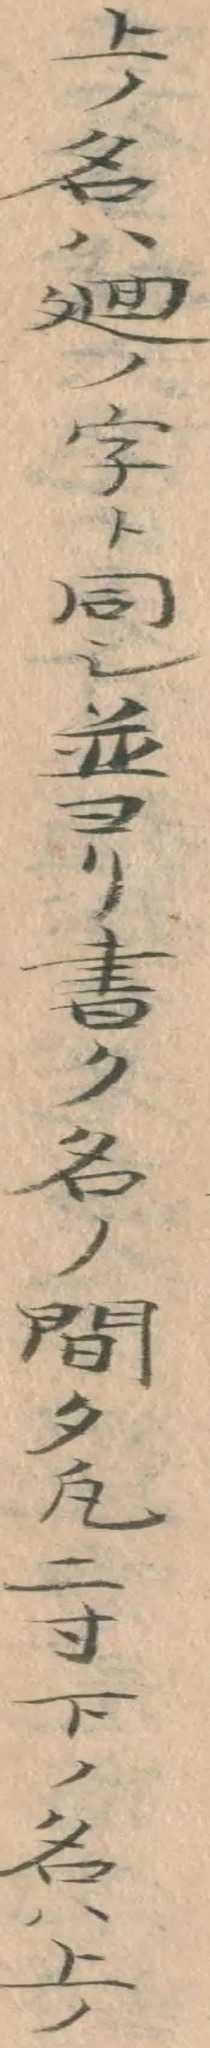上ノ名ハ廻ノ字ト同シ並ヨリ書ク名ノ間タ凡二寸下ノ名ハ上ノ
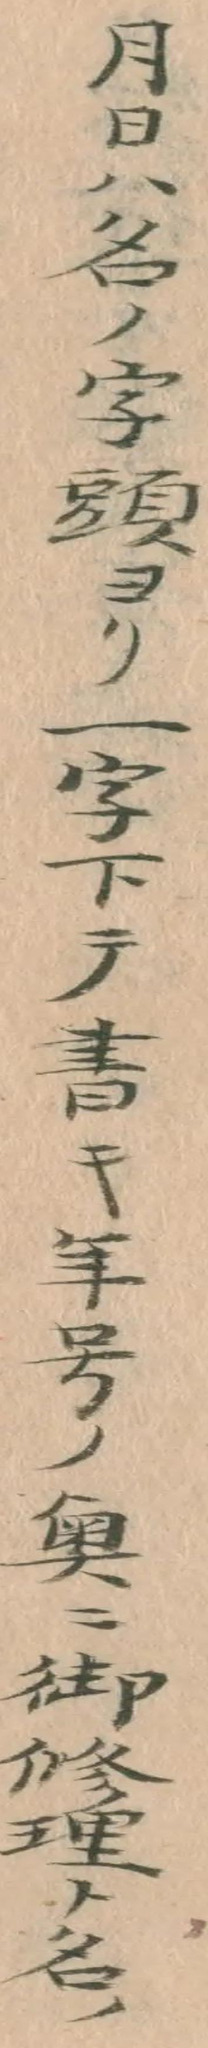月日ハ名ノ字頭ヨリ一字下テ書キ年号ノ奥ニ御修理ト名ノ
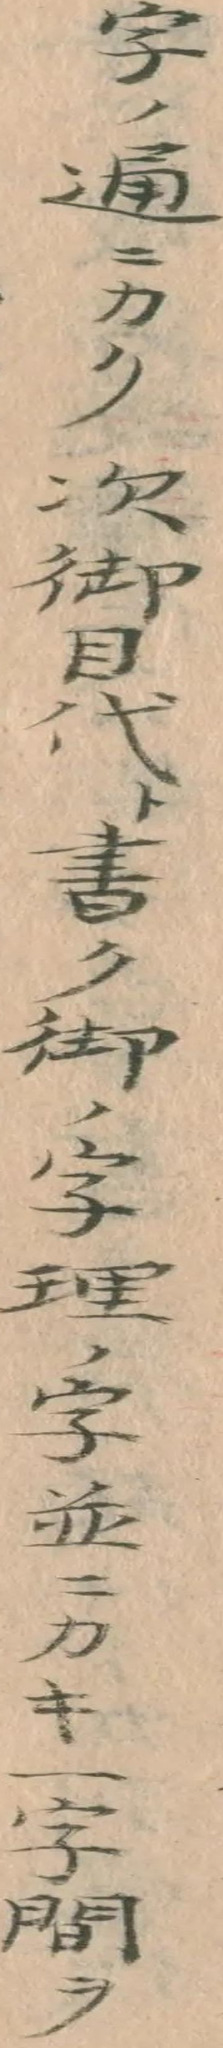字ノ通ニカク次御目代ト書ク御ノ字理ノ字並ニカキ一字間ヲ
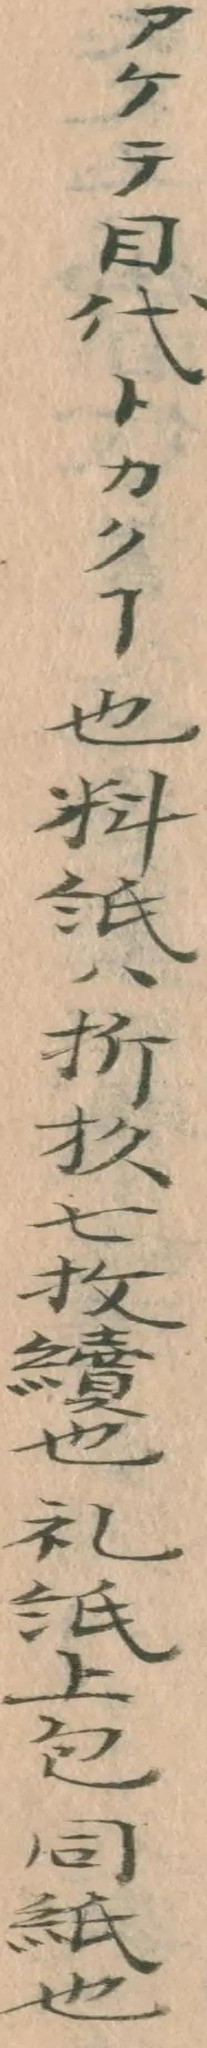アケテ目代トカクヿ也料紙ハ折杦七枚續也礼紙上包同紙也
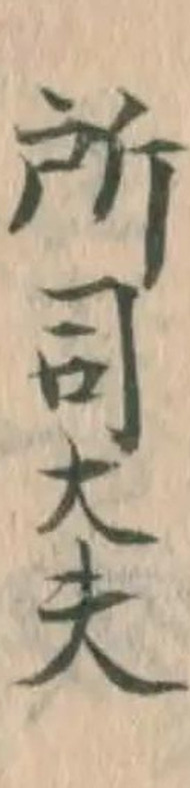所司大夫

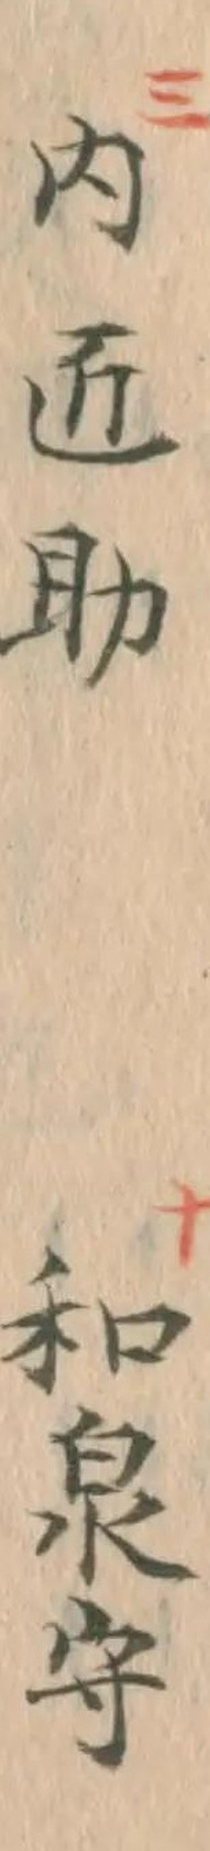内匠助和泉守
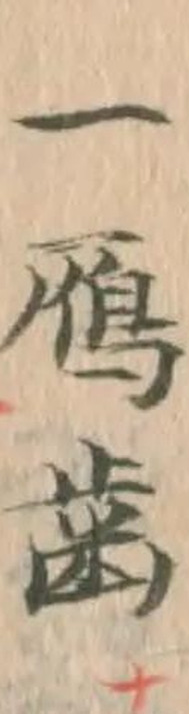一雁葉
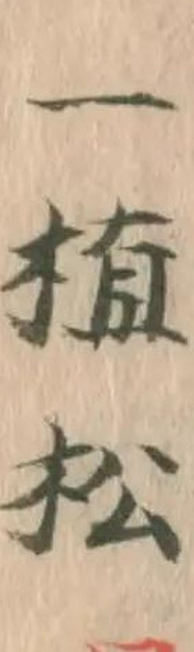一植松
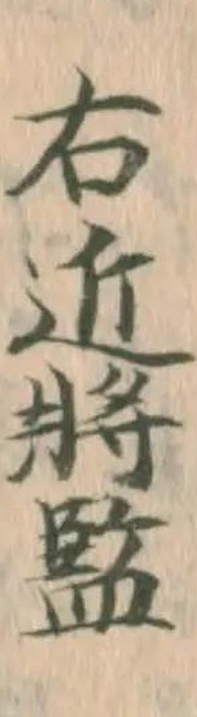右近将監
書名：賀茂社記録. 第40冊
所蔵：国立国会図書館 National Diet Library, JAPAN
